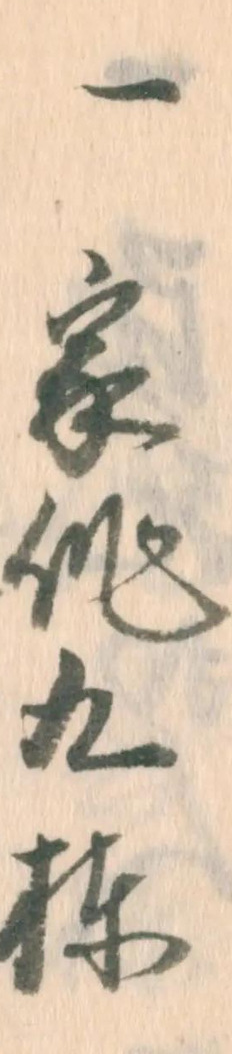一家作九棟
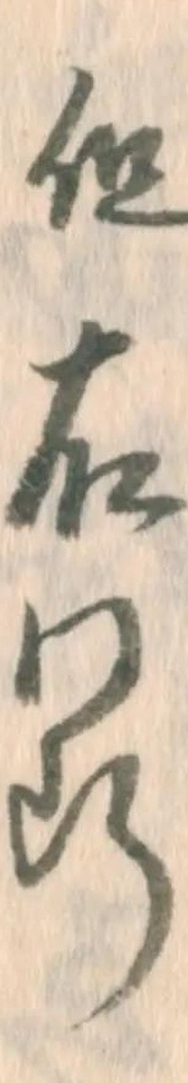但右同断
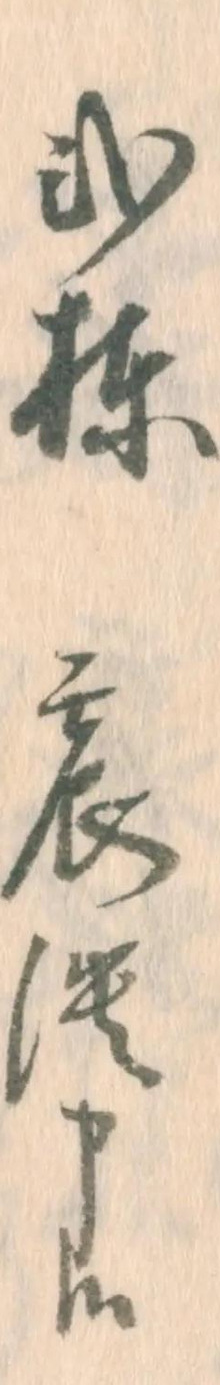内弐棟震潰申候
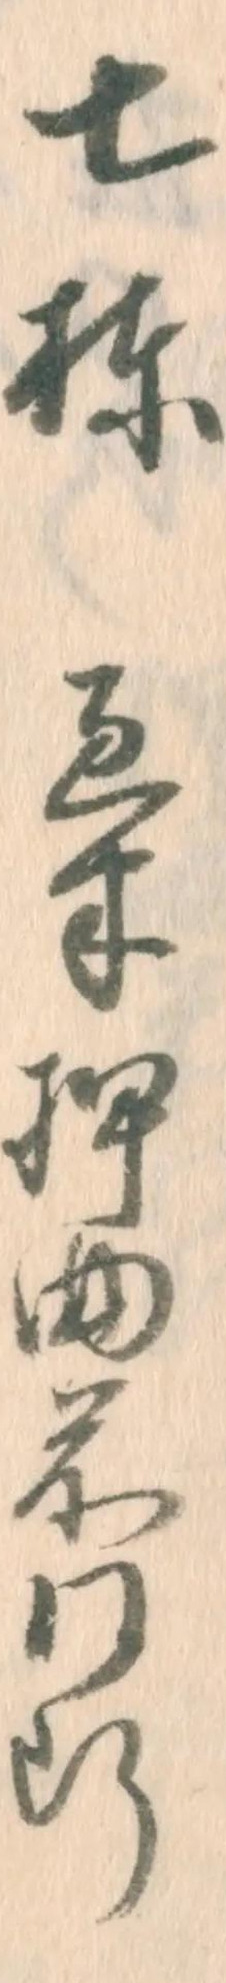七棟過半押曲前同断
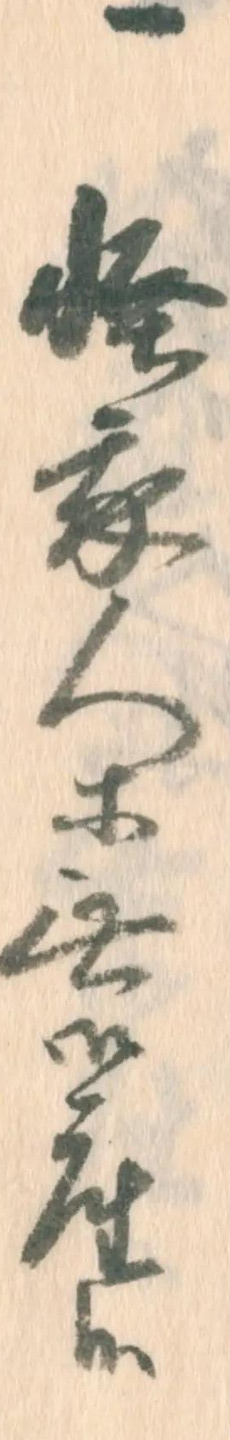一怪我人等無御座候

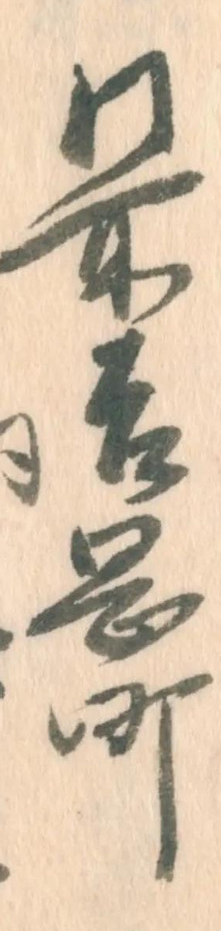同所吉岡町
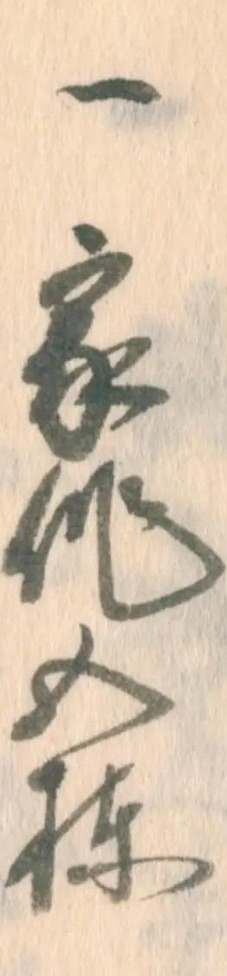一家作五棟
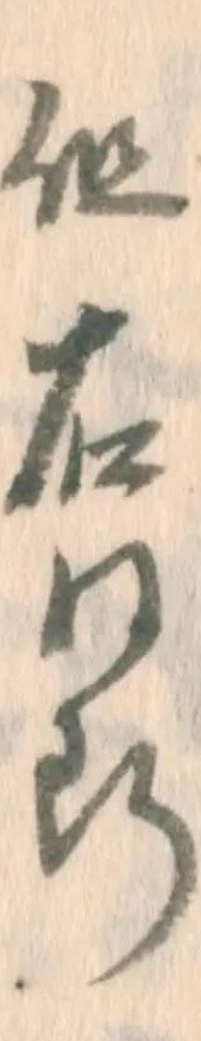但右同断
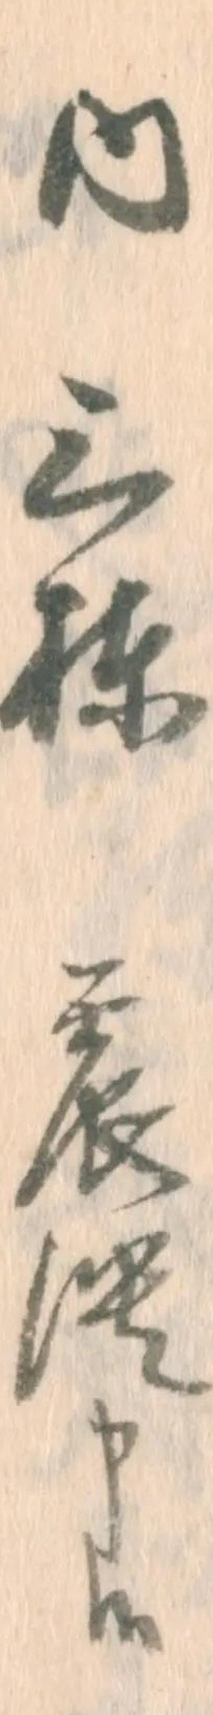内三棟震潰申候
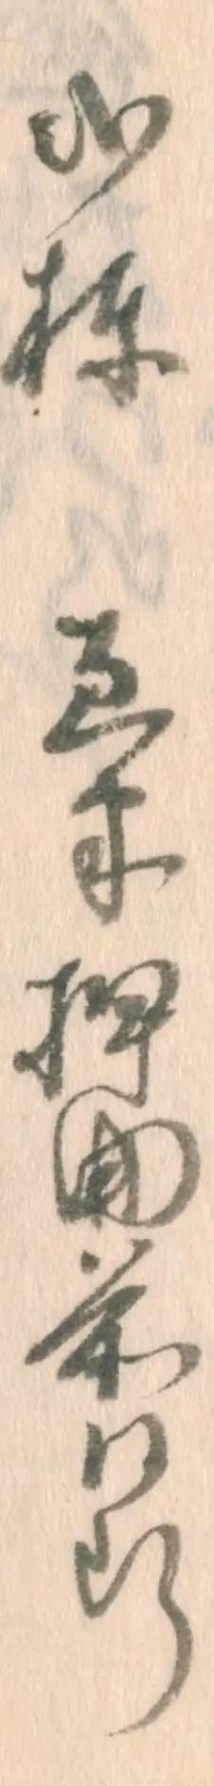弐棟過半押曲前同断
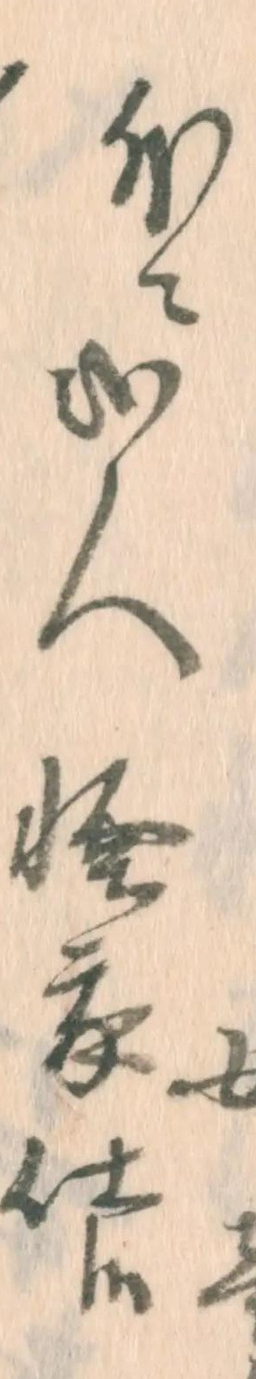外ニ弐人怪我仕候
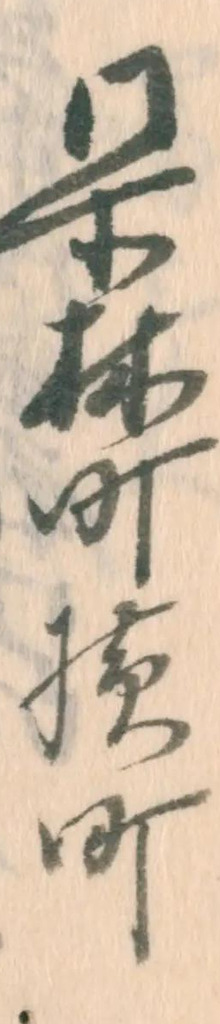同所林町横町
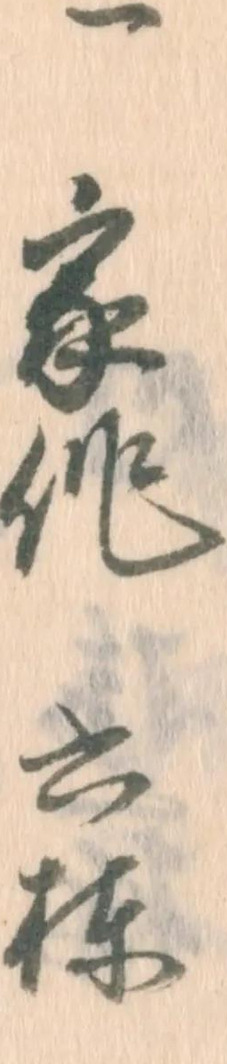一家作六棟
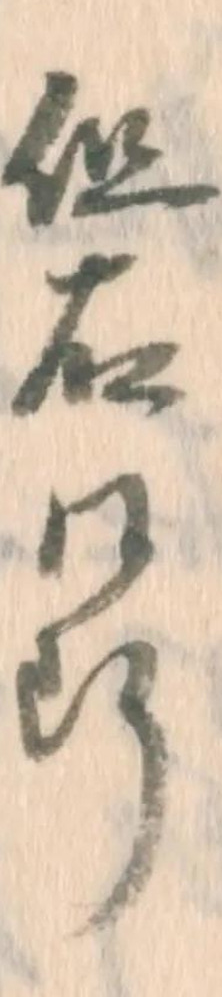但右同断
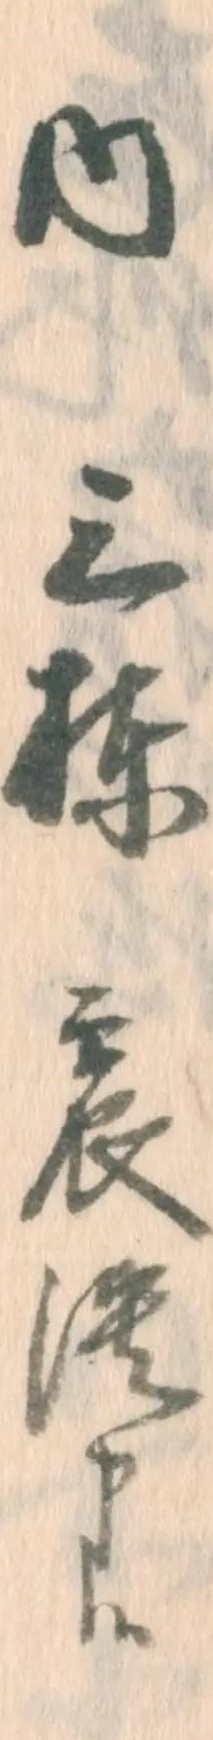内三棟震潰申候
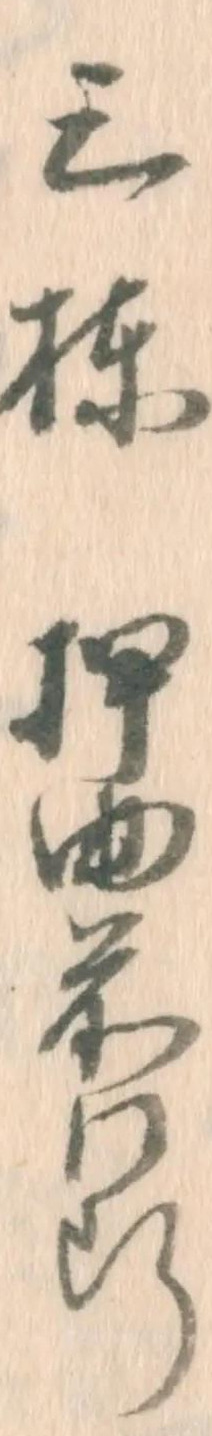三棟押曲前同断
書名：地震災書留 2巻. [1] 内表紙に「地震災書留　安政二卯年　但本所深川御用屋敷地代免除調」とあり
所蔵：国立国会図書館 National Diet Library, JAPAN
